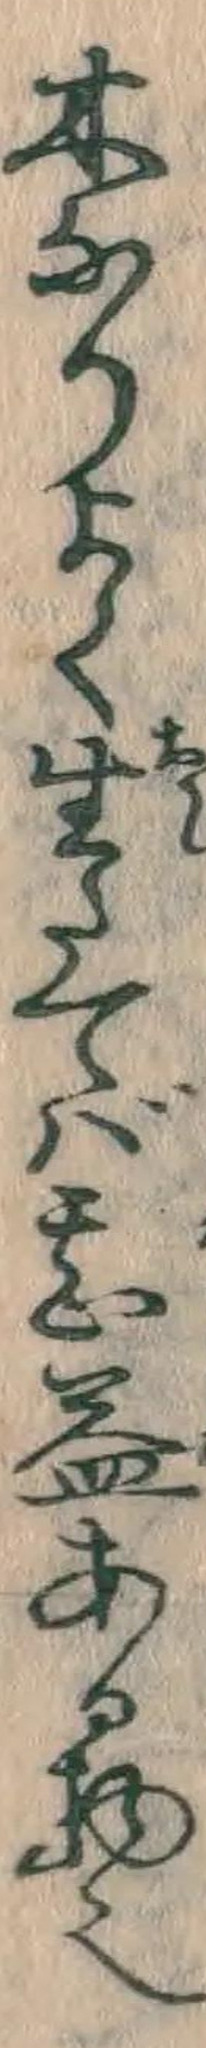木なりよく生たてば甚益ある物也
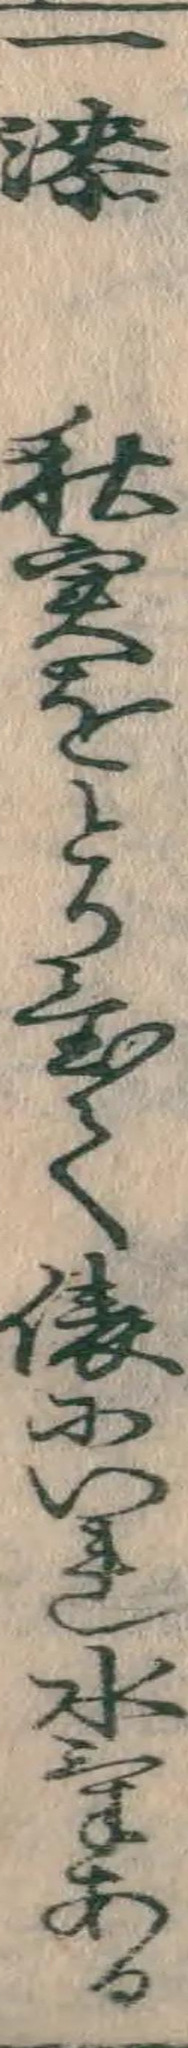一漆秋実をとり置て俵にいれ水気ある
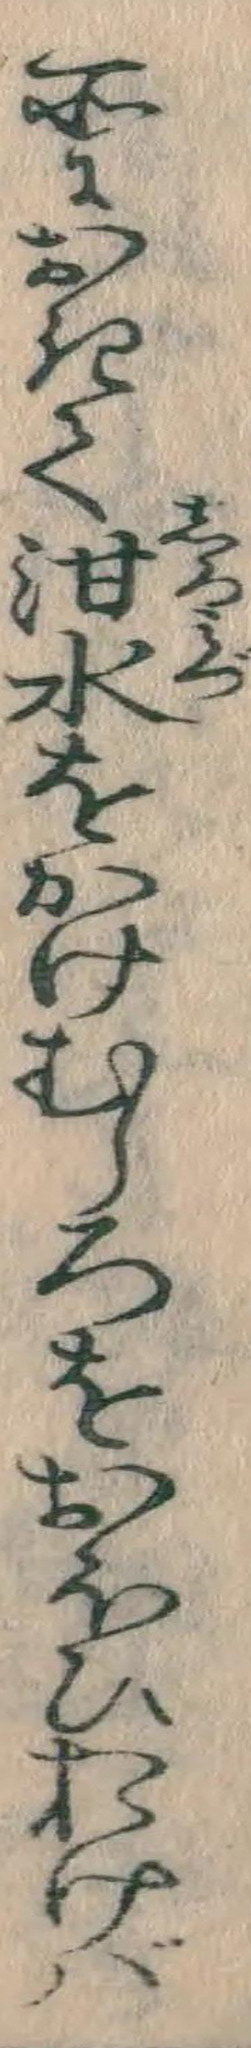所におきて泔水をかけむしろをおほひおけば
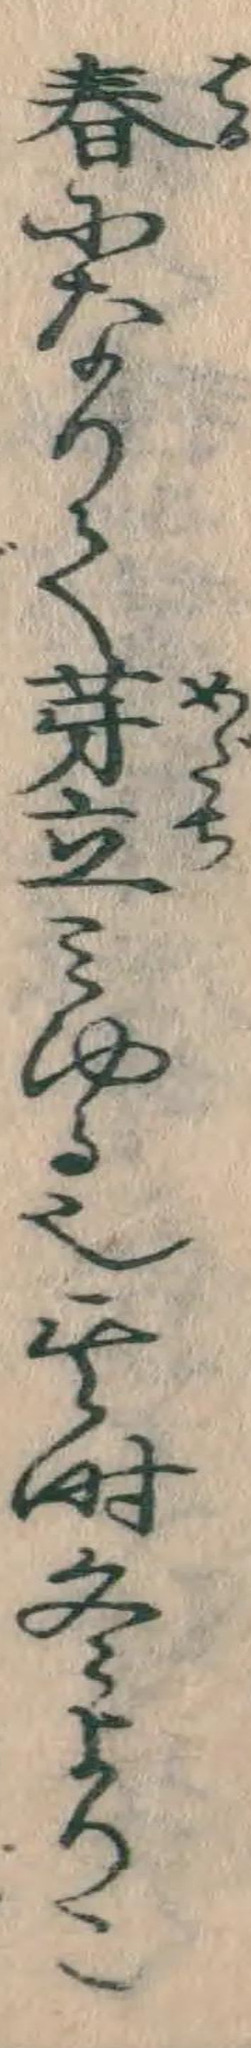春になりて芽立みゆる也其時冬よりこ
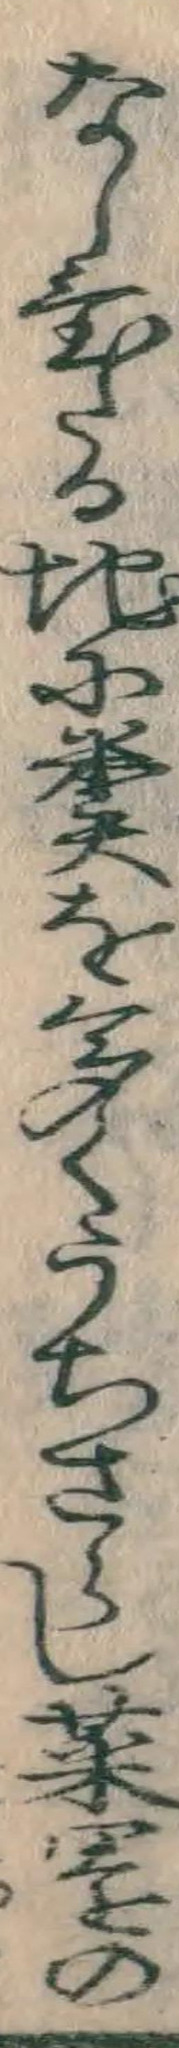なし置たる地に糞を多くうちさらし菜園の
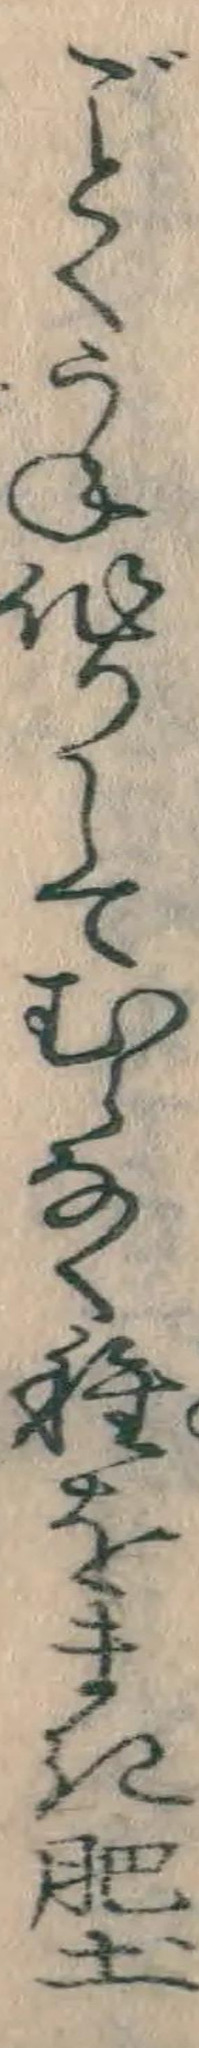ごとくうね作りしてむらなく種をまき肥土
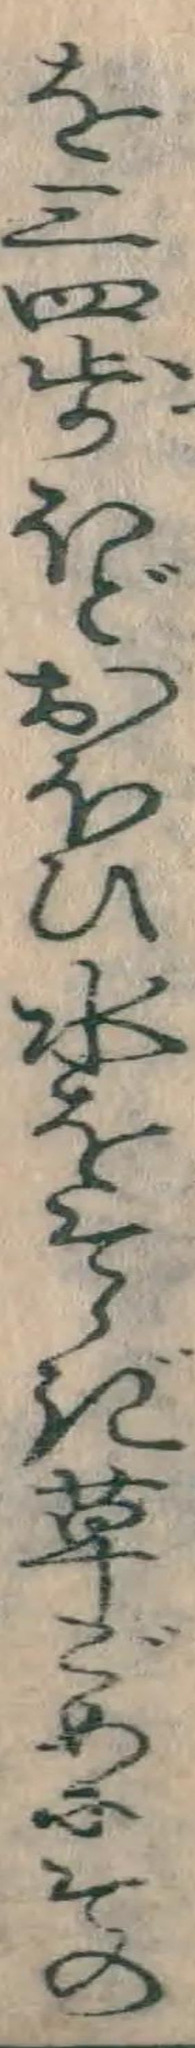を三四歩ほどおほひ水をそゝぎ草ごめにその
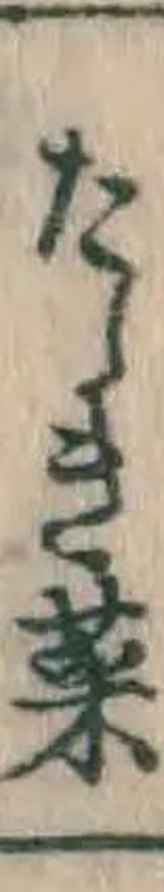たゝき菜
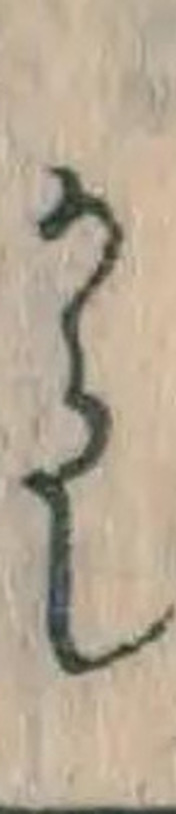からし
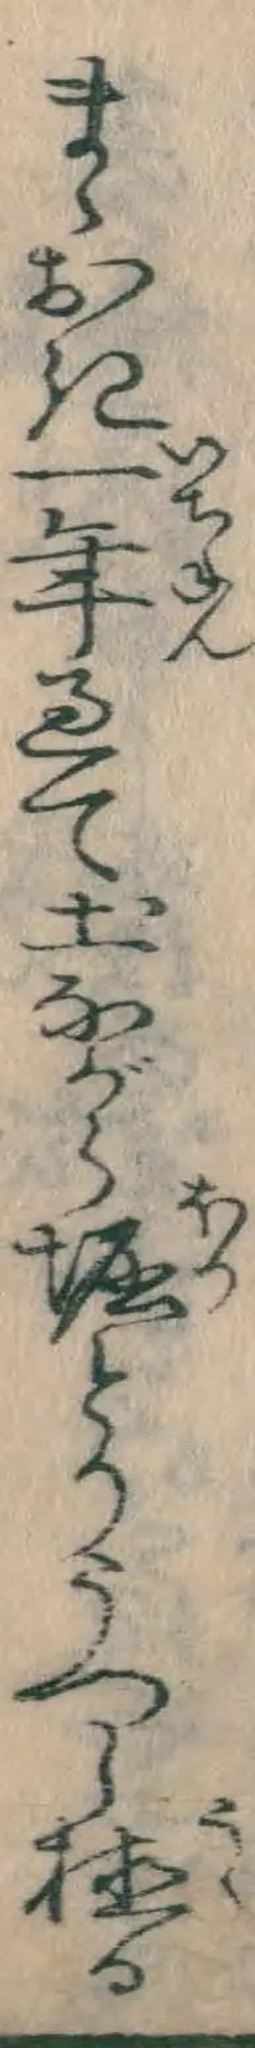まゝおき一年過て土ながら堀とりうつし植る
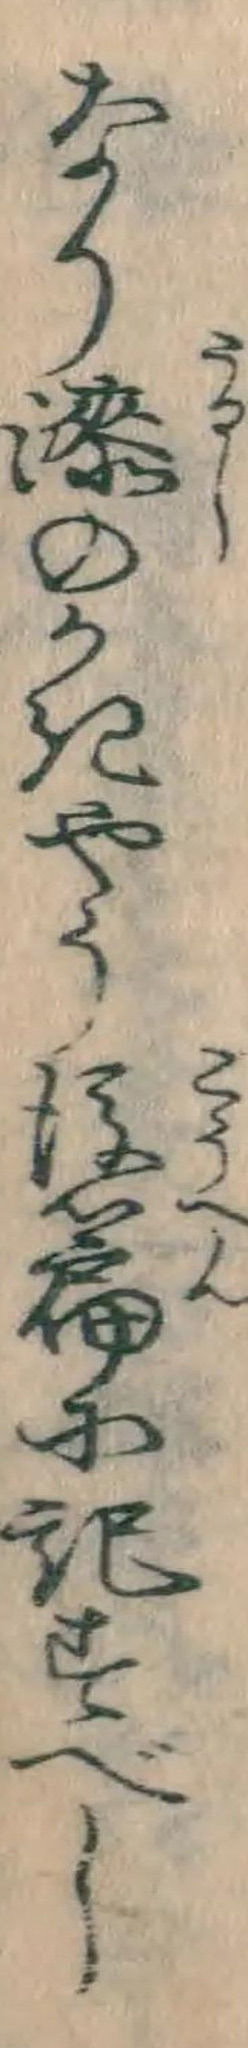なり漆のかきやう後篇に記すべし
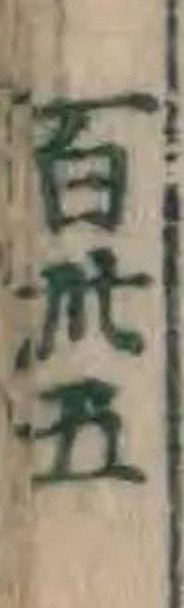百卅五

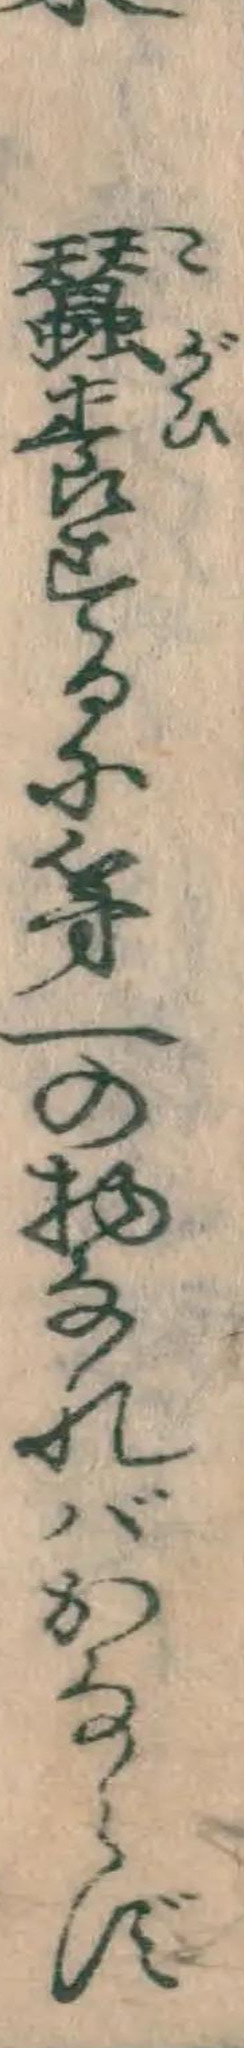一桑蚕養するに第一の物なればかならず
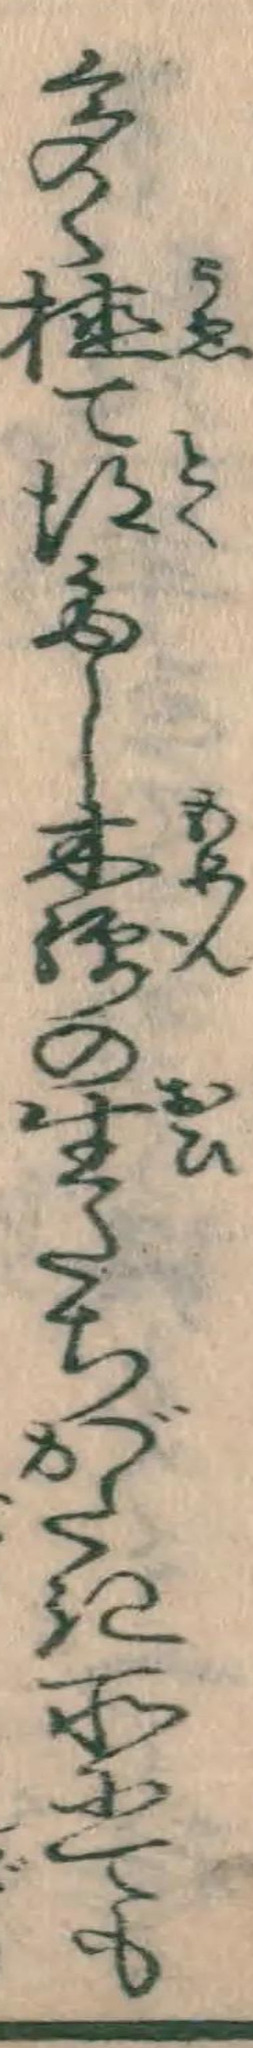多く植て得多し木綿の生たちがたき所にても
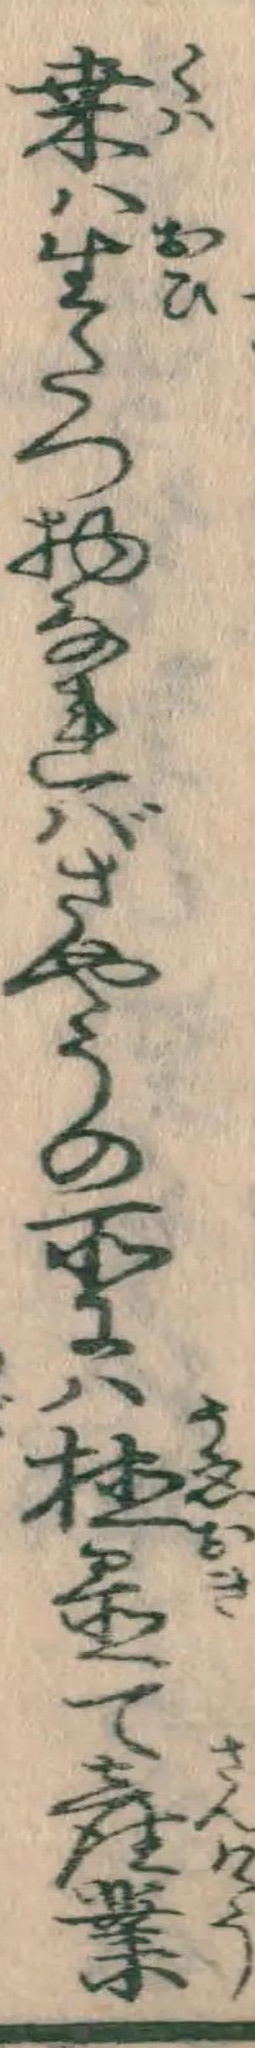桑は生たつ物なればさやうの所には植置て産業
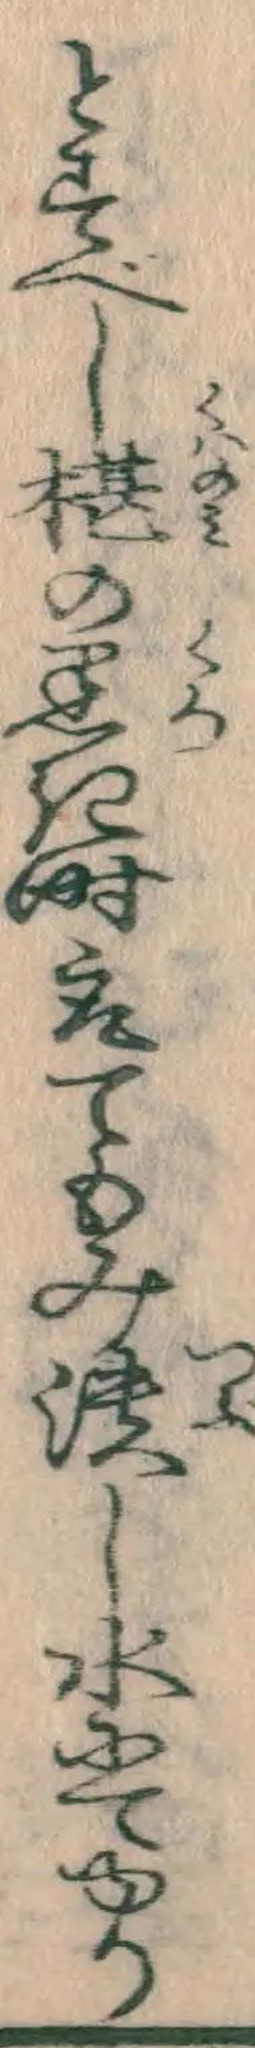とすべし椹の黒き時取てもみ潰し水にてゆり
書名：広益秘事大全 3巻. [5]
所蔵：国立国会図書館 National Diet Library, JAPAN
